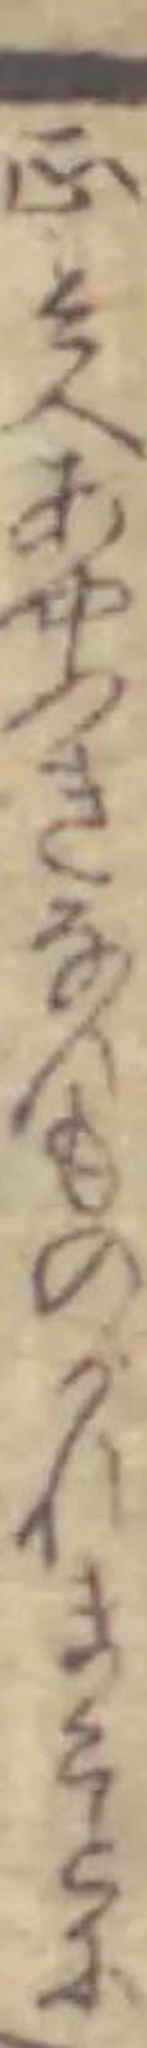正兵へあやふきなんものがれまことに
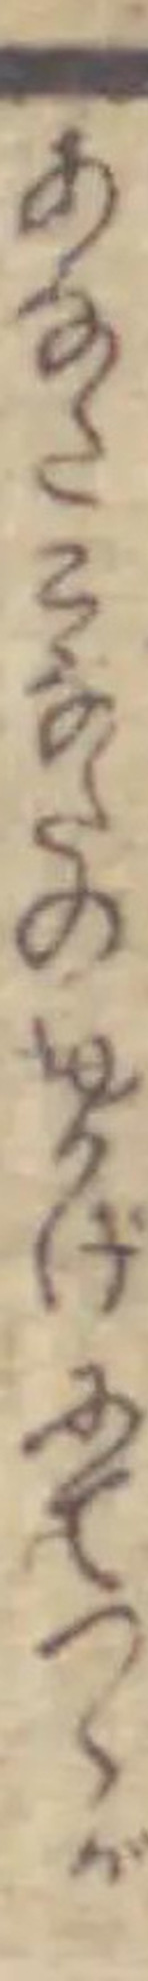あなたこなたのおかげにてつゝが
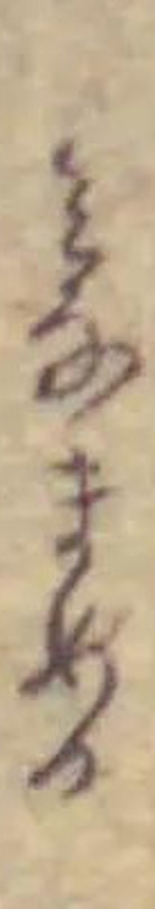みなまめか
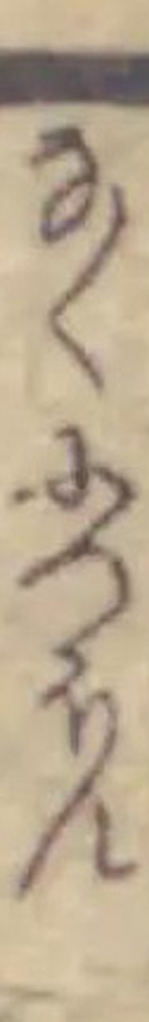なくにつほん
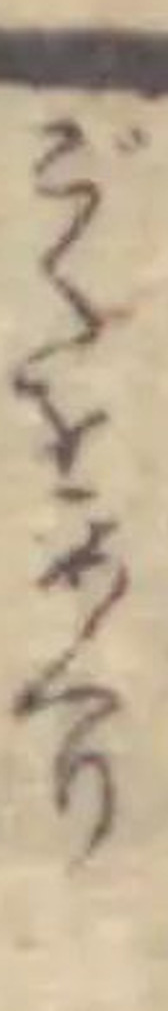ごくをめくり
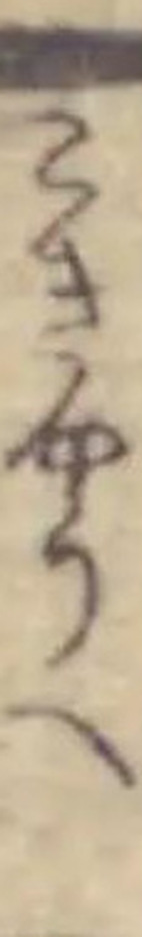こきやうへ
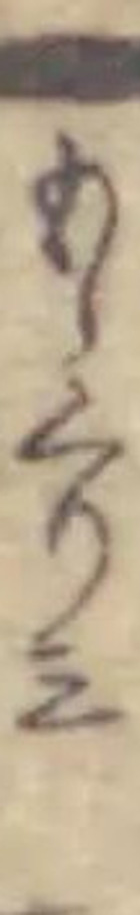もゝくり三
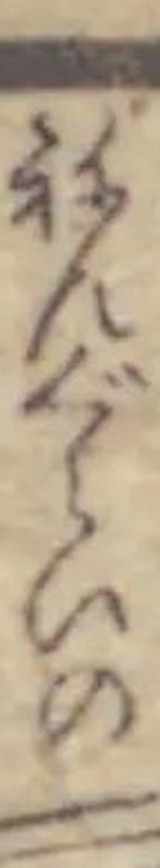ねんぐらいの
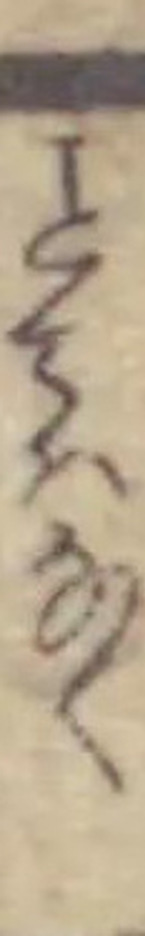ことてはなく
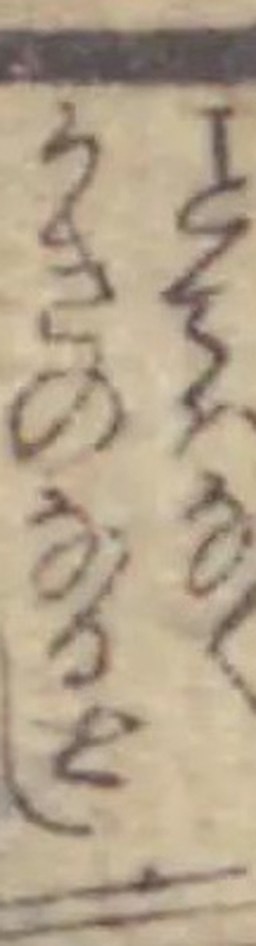かきのなるとし
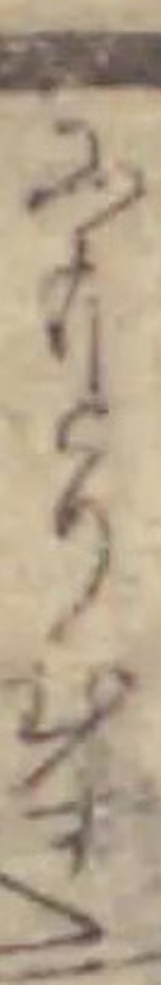にもとりむす
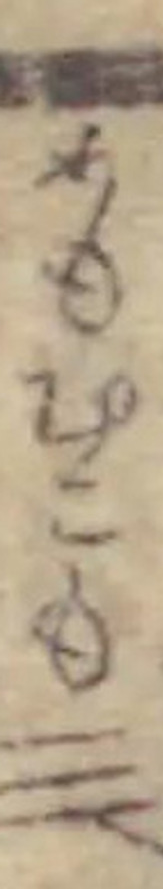めもむこも
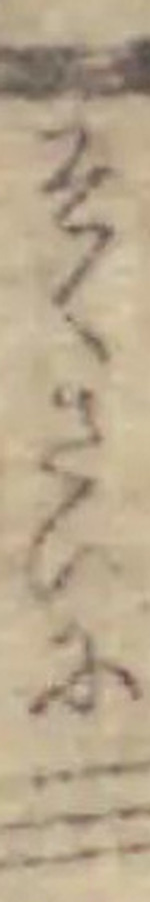そくさいに

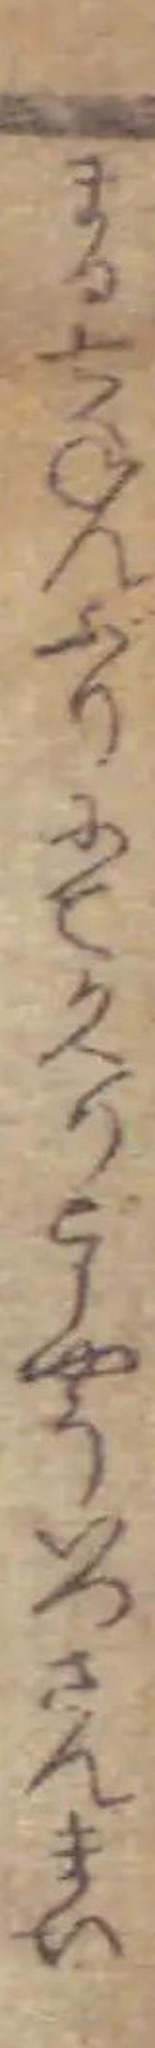まる七ねんぶりにてかへりごしやういつさんまい
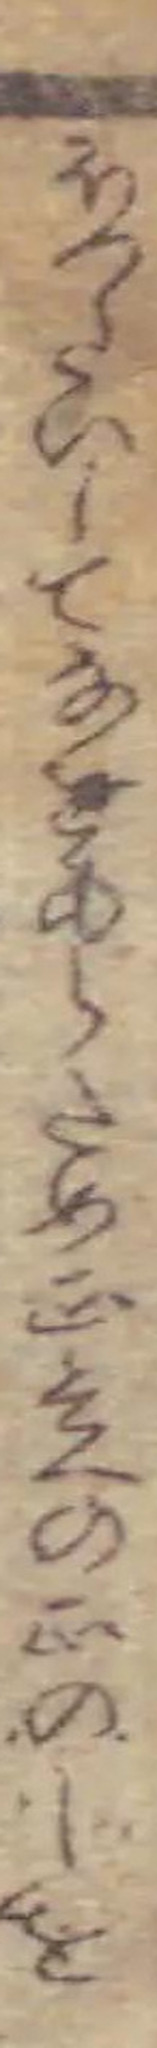ほつたいしてなをあらため正兵への正のじを
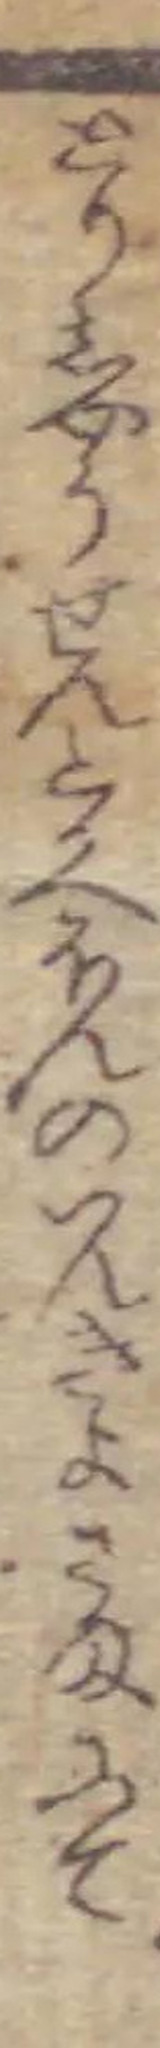とりしやうせんとかへほんのいんきよさまにて
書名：もふもふもふ怖噺 2巻
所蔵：国立国会図書館 National Diet Library, JAPAN
